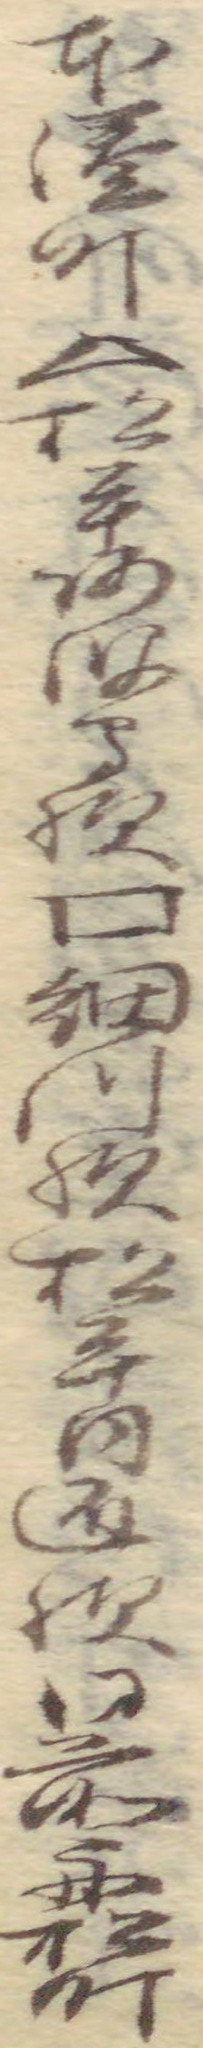本湊町△松平阿波守様細川様松平内匠様同前舟松町
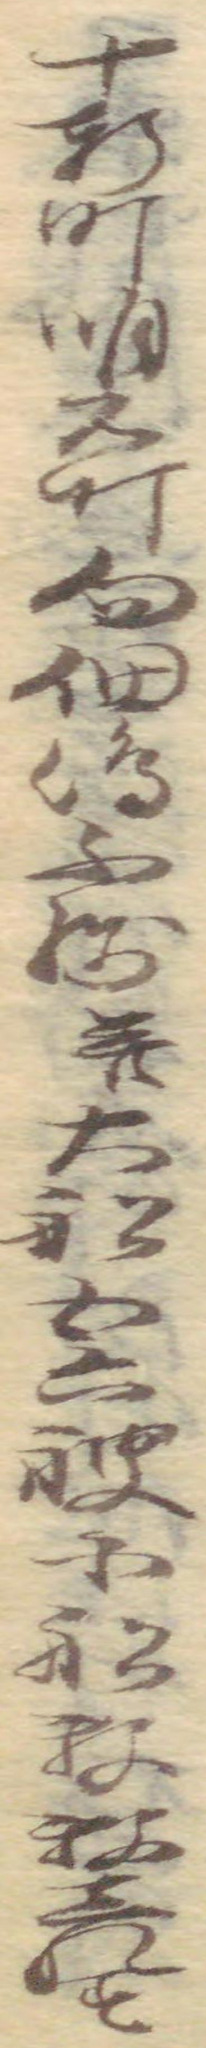十軒町明石町向佃嶋不残幷大船五六艘小船数数しれす

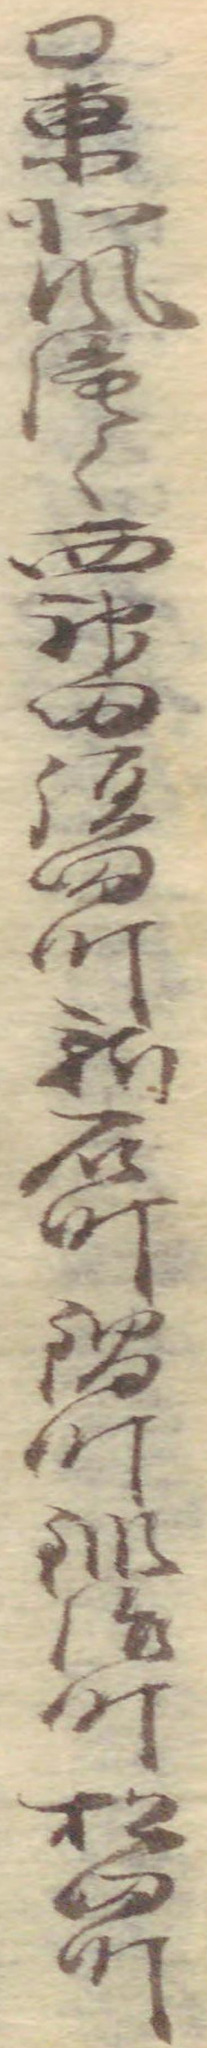〇東北風強く西神田須田町新石町鍋町鍛治町松田町
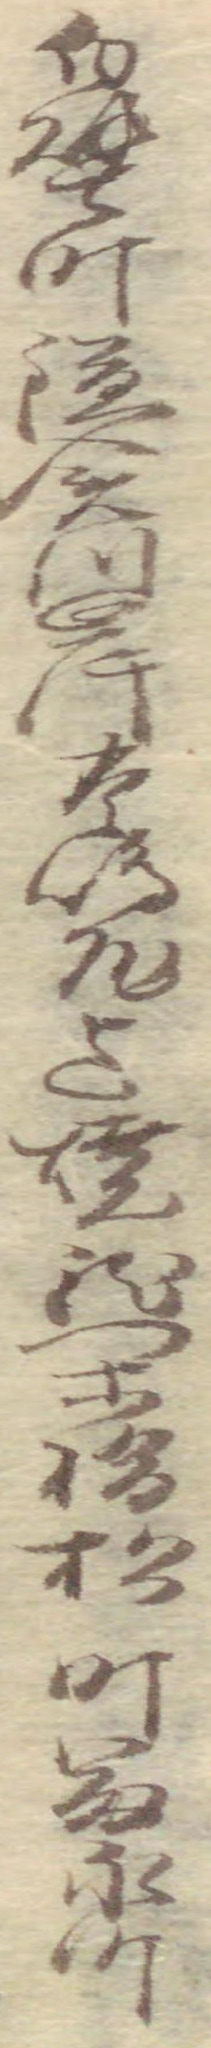白壁町鎌倉川岸豊嶋屋迄焼龍閑橋松町冨永町
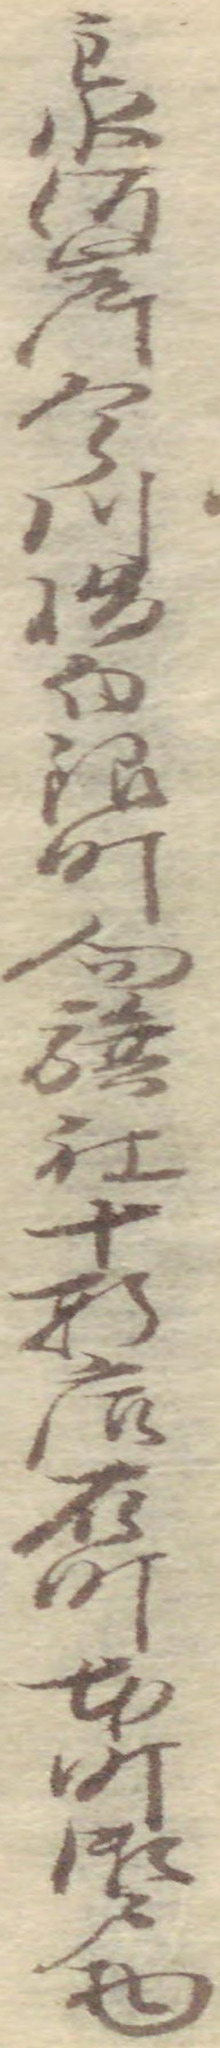主水河岸今川橋白銀町向旗社十軒店石町本町瀬戸物
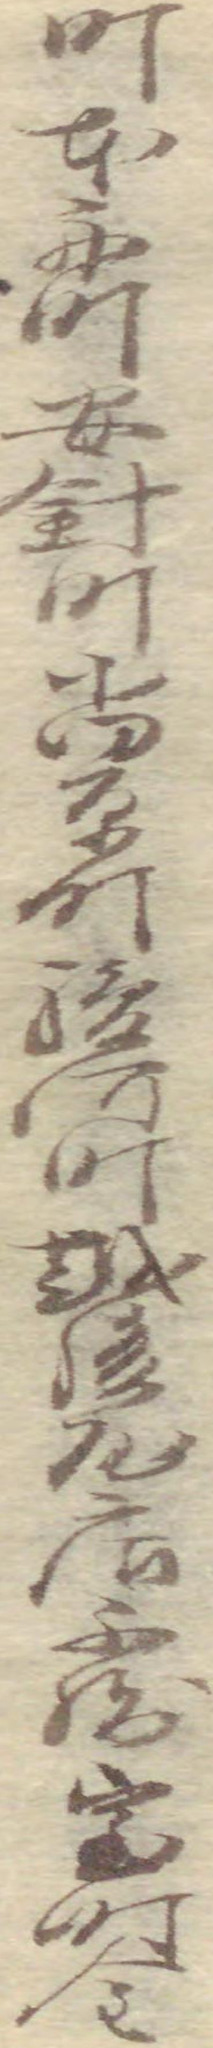町本舟町安針町小田原町駿河町越後屋店不残宝町金
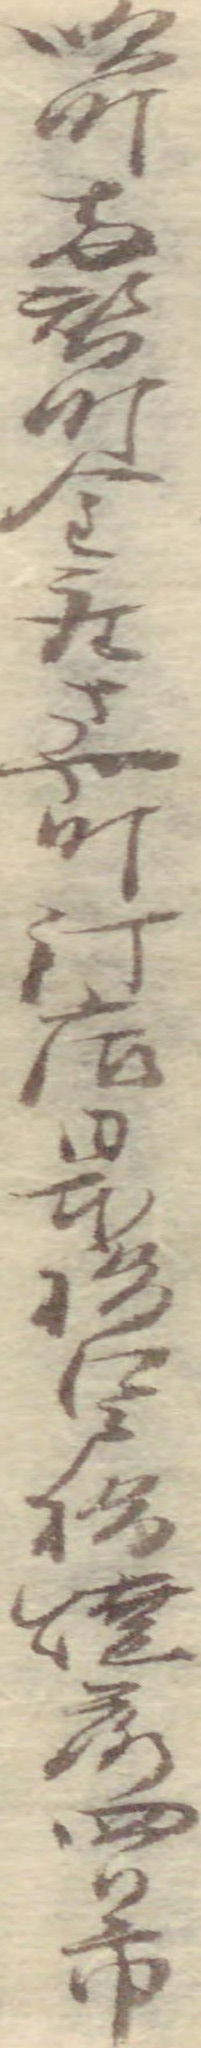吹町両替町金座さや町釘店日本橋江戸橋焼落四日市
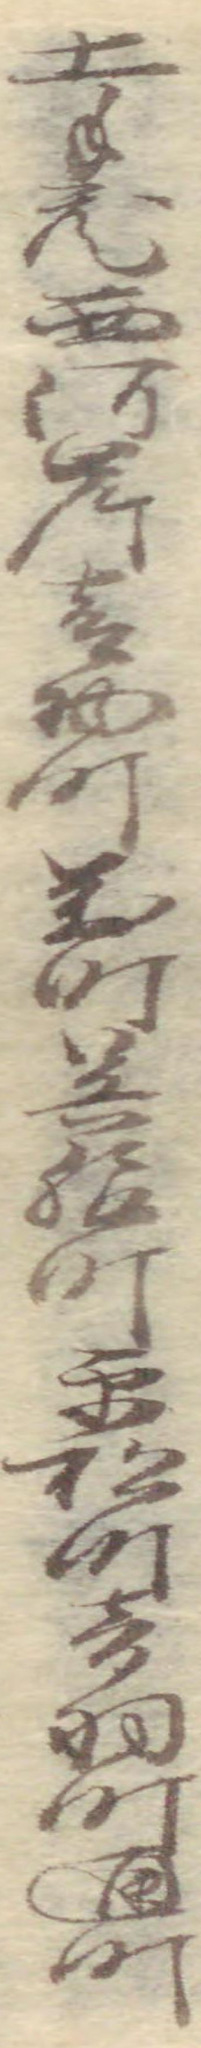土手藏西河岸青物町萬町呉服町平松町音羽町通町
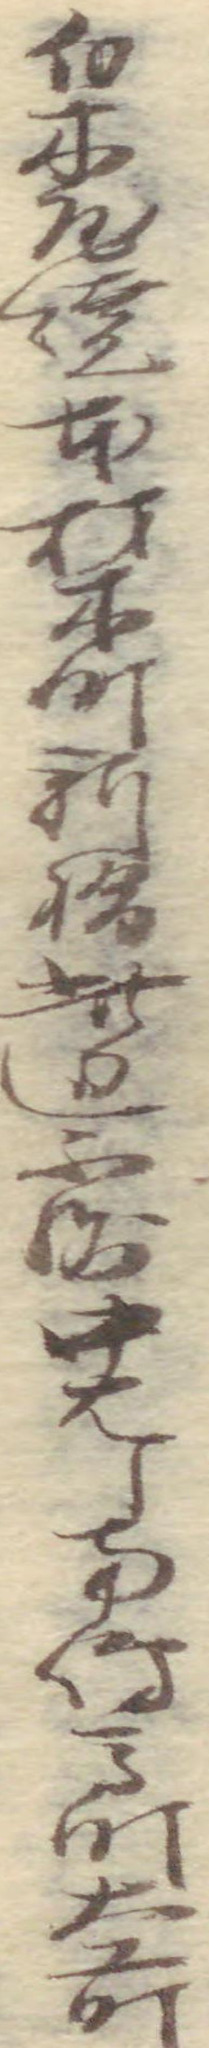白木屋焼本材木町新橋此辺不残中はし南伝馬町大工町
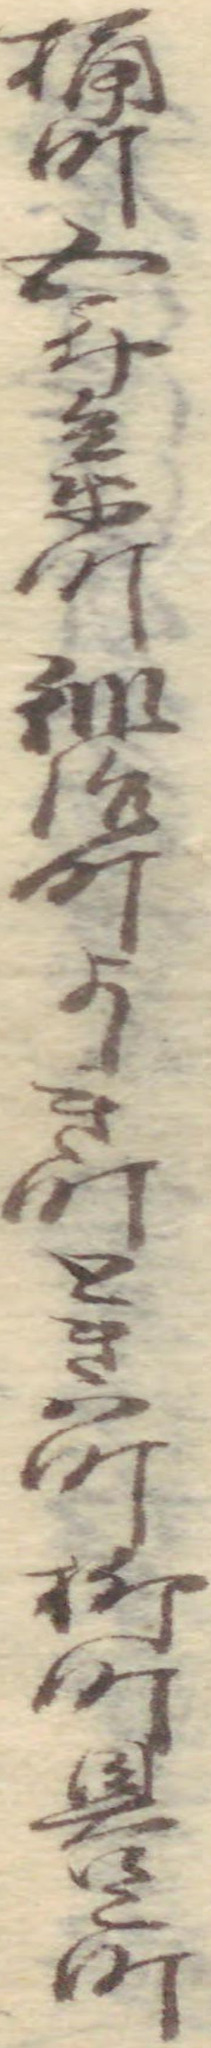桶町五郎兵衛町鍛冶町よしき町ときハ町柳町具足町
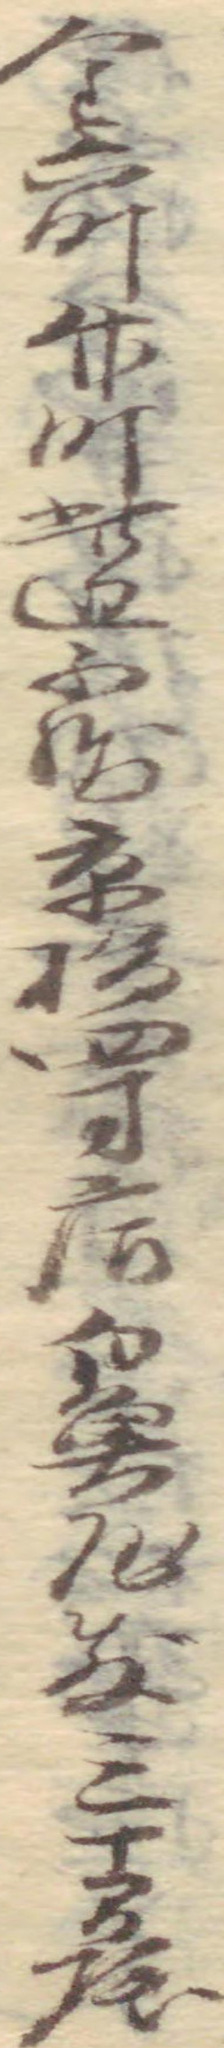金六町竹町此辺不残京橋四方店白魚屋敷三十間堀
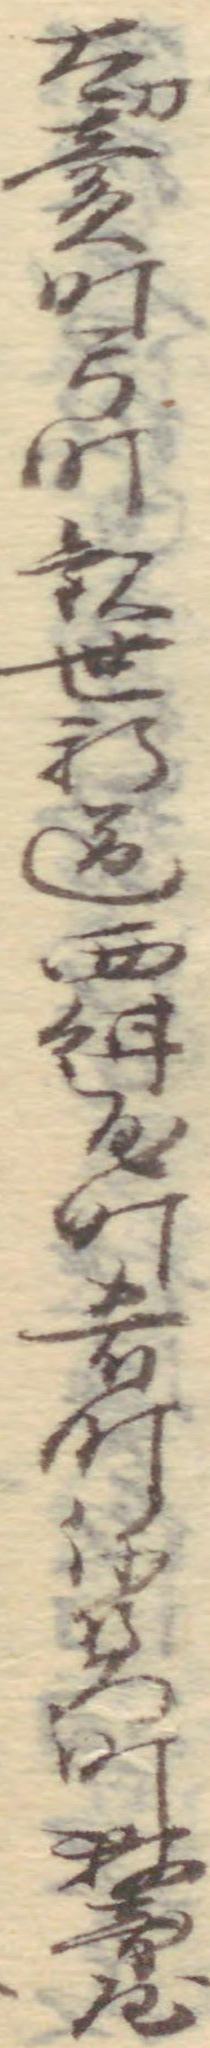太刀売町弓町観世新道西紺屋町肴町弥左衛門町数寄屋
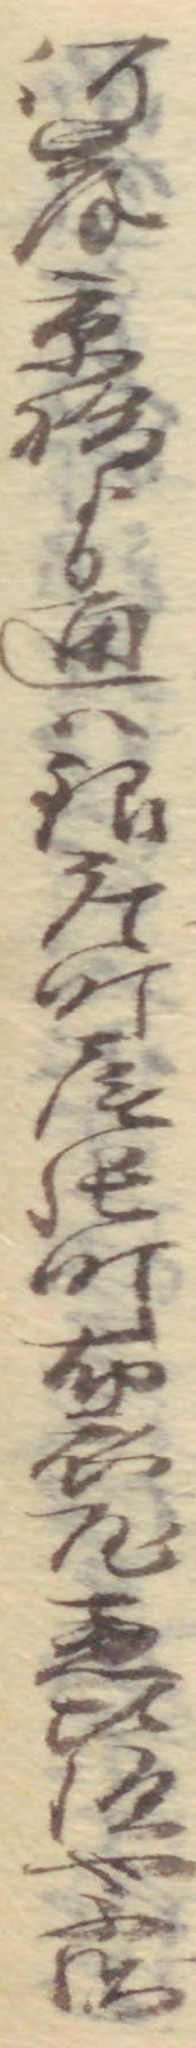河岸京橋より通ハ銀座町尾張町布衣屋恵比須や不残
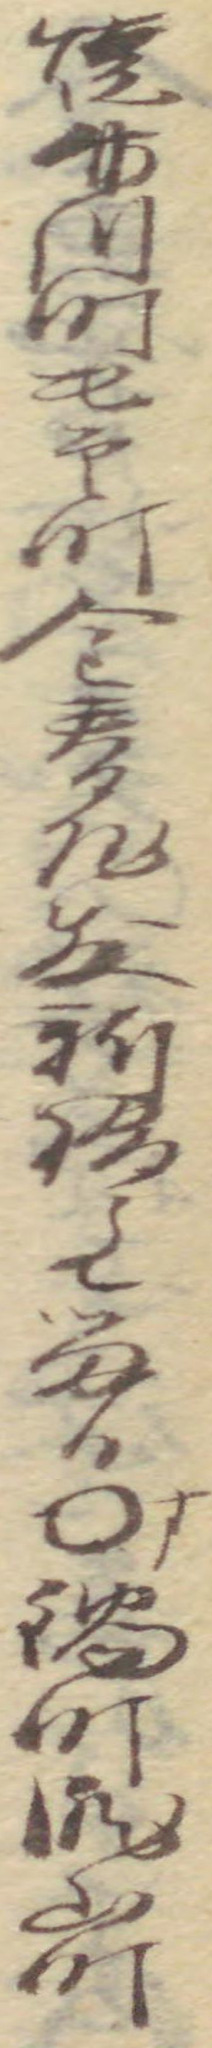焼竹川町出雲町金春屋敷新橋ニて留る〇鍋町瀧山町
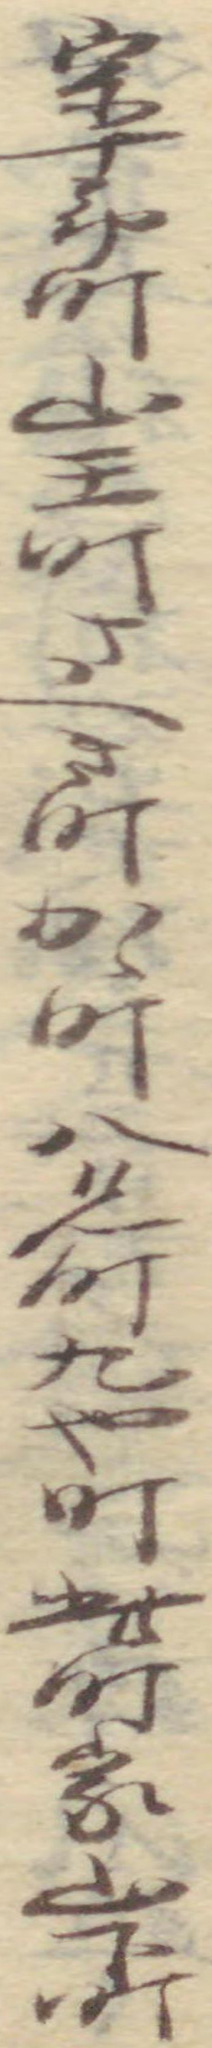宗十郎町山王町さへき町かゝ町八けん町九や町此町家山下町
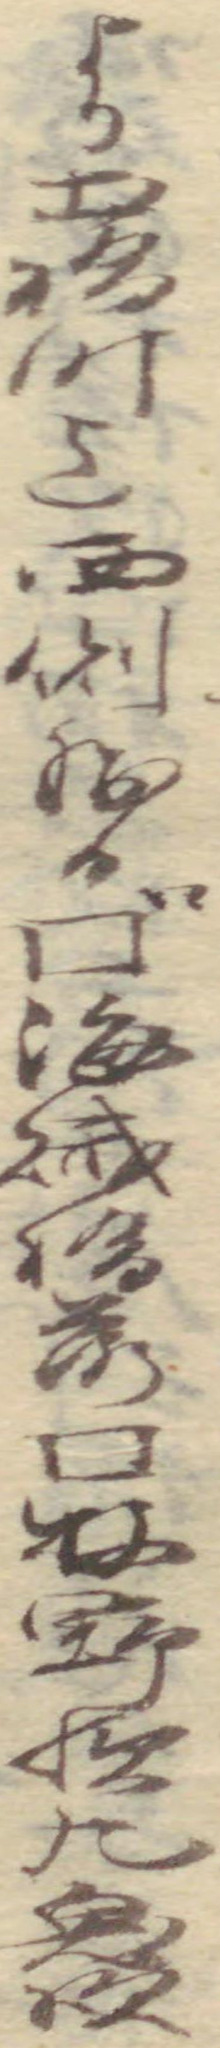より土橋町迄西側残る海賊橋落牧野様九鬼様
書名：鶯宿雑記. 巻199-200
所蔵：国立国会図書館 National Diet Library, JAPAN
